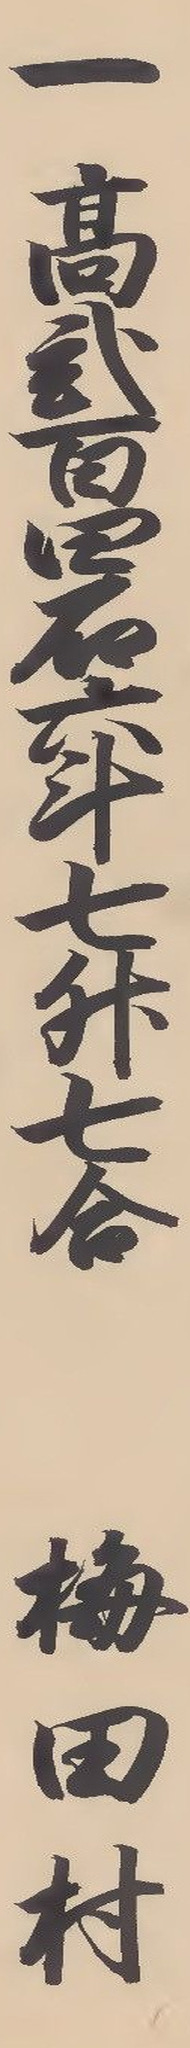一高弐百四石六斗七升七合梅田村
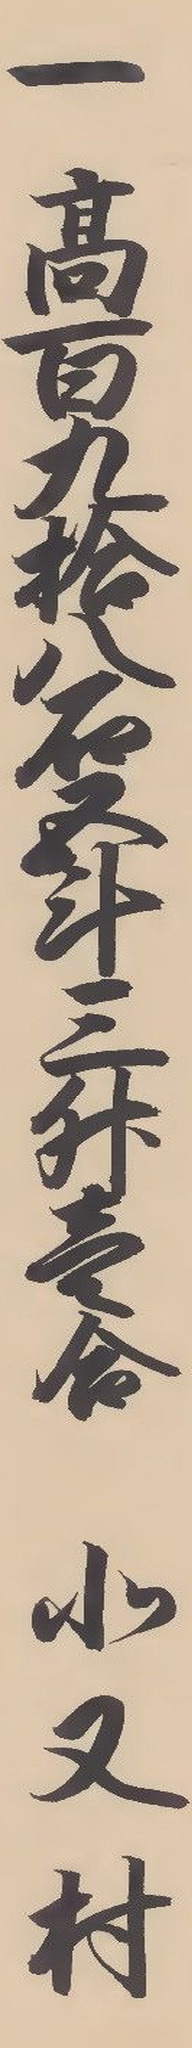一高百九拾八石五斗三升壱合北又村
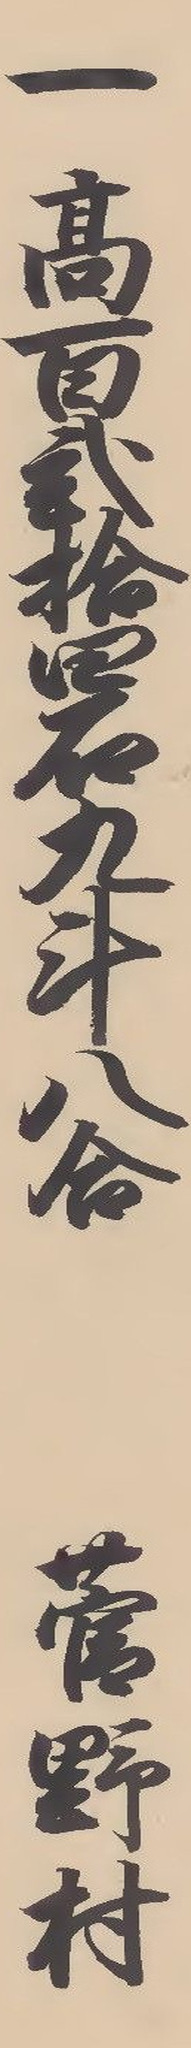一高百弐拾四石九斗八合菅野村
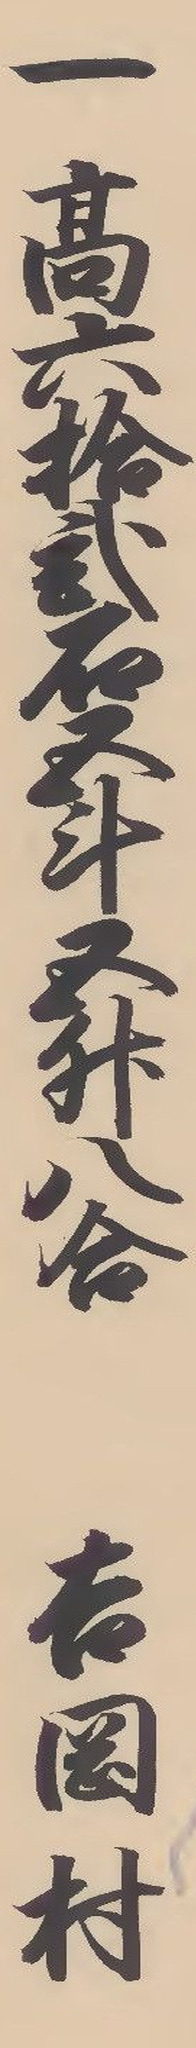一高六拾弐石五斗五升八合吉岡村

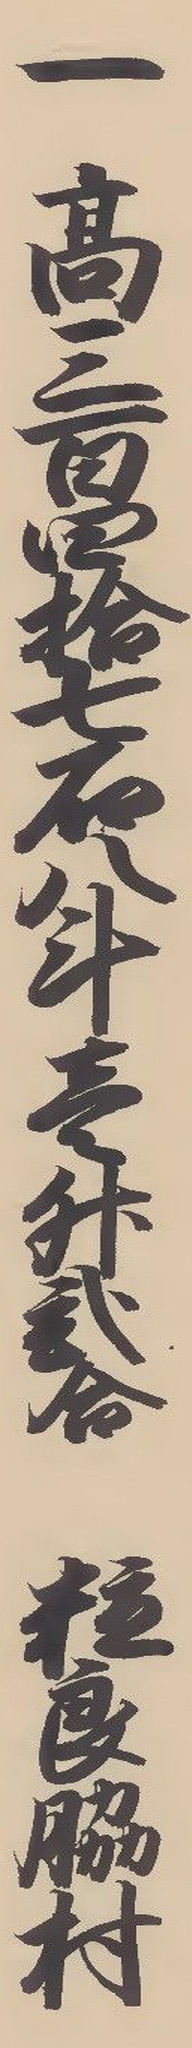一高三百四拾七石八斗壱升弐合粒良脇村
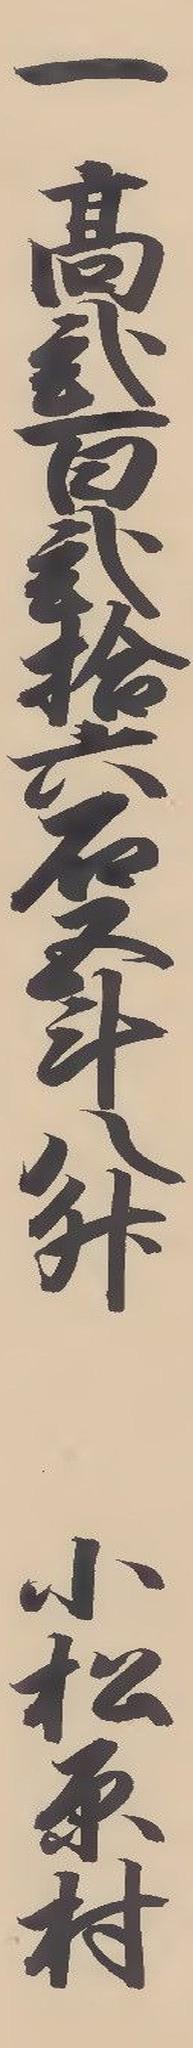一高弐百弐拾六石五斗八升小松原村
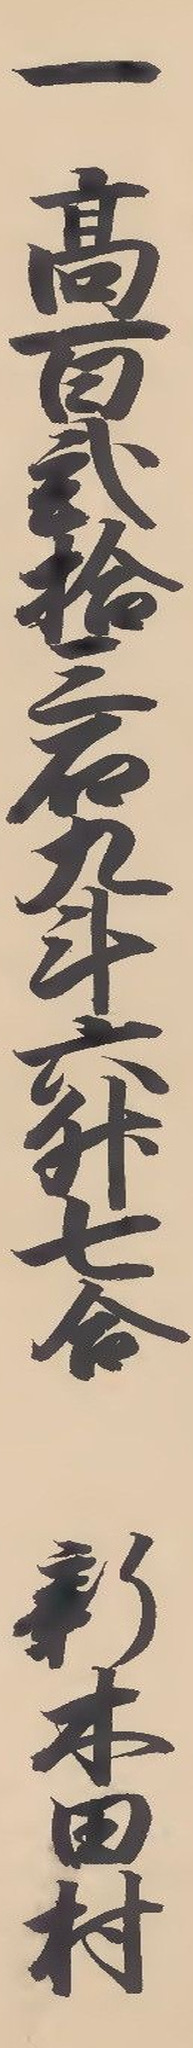一高百弐拾三石九斗六升七合新木田村
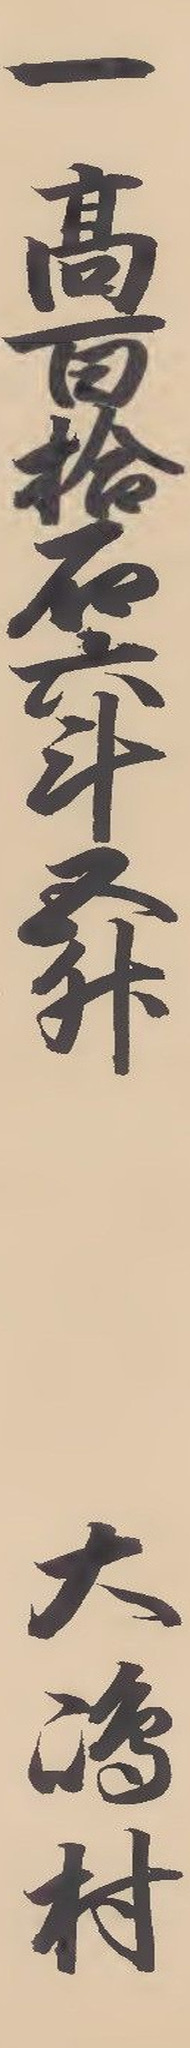一高百拾石六斗五升大島村
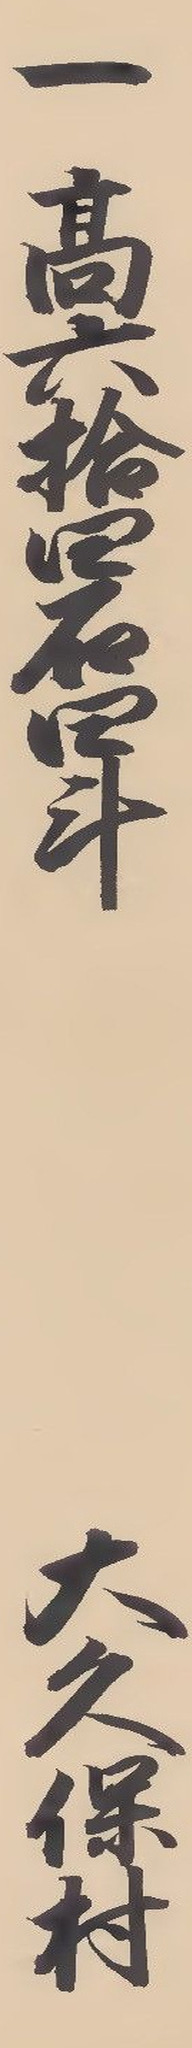一高六拾四石四斗大久保村
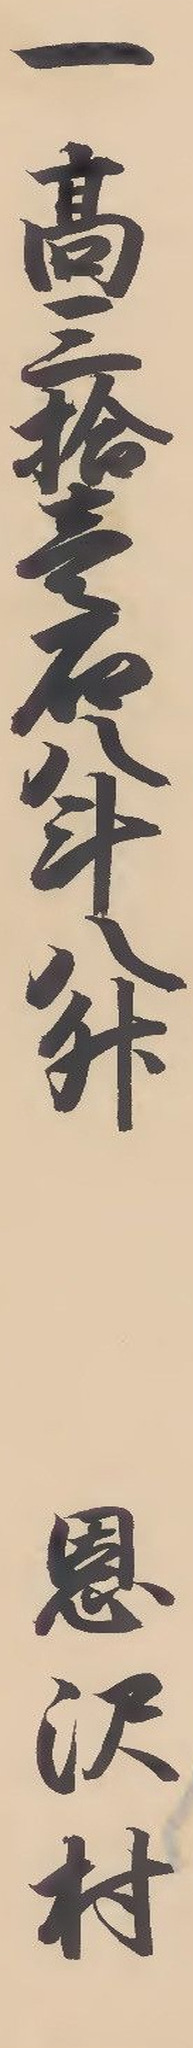一高三拾壱石八斗八升恩沢村

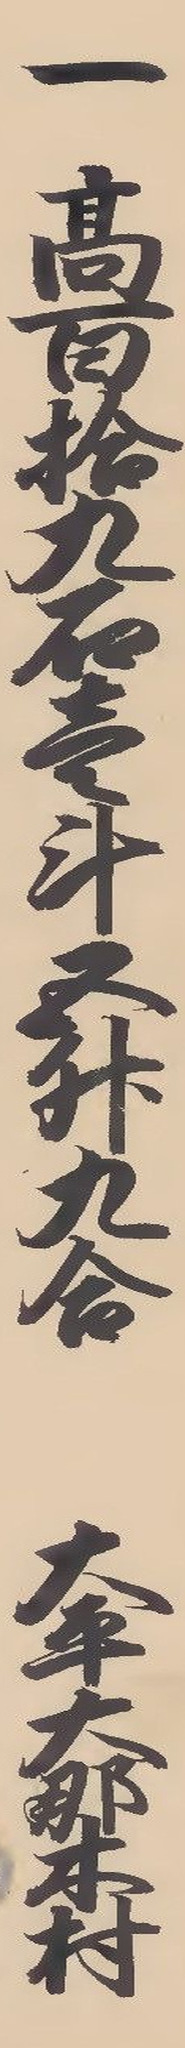一高百拾九石壱斗五升九合大平大那木村
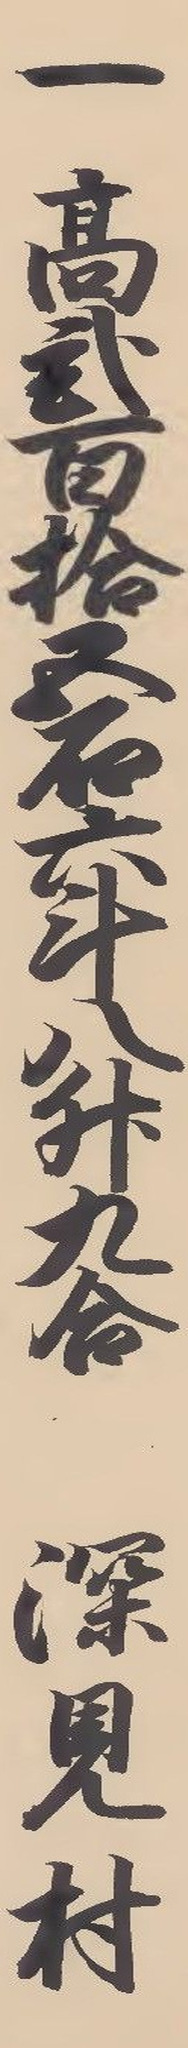一高弐百拾五石六斗八升九合深見村
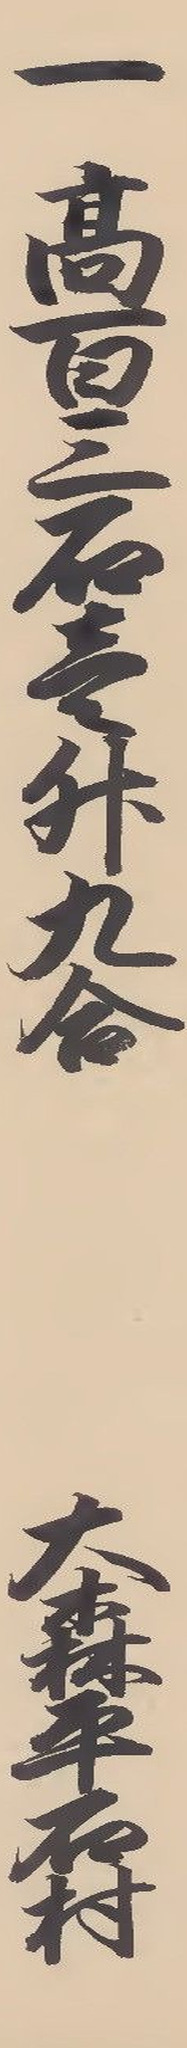一高百三石壱升九合大森平石村
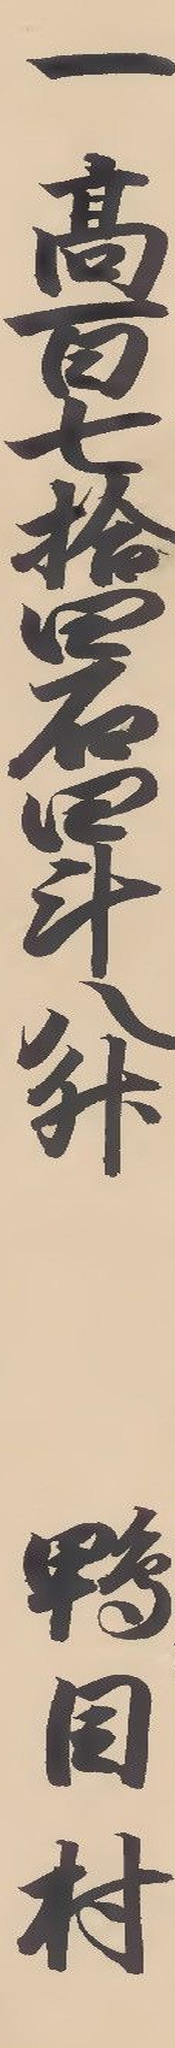一高百七拾四石四斗八升鴨目村
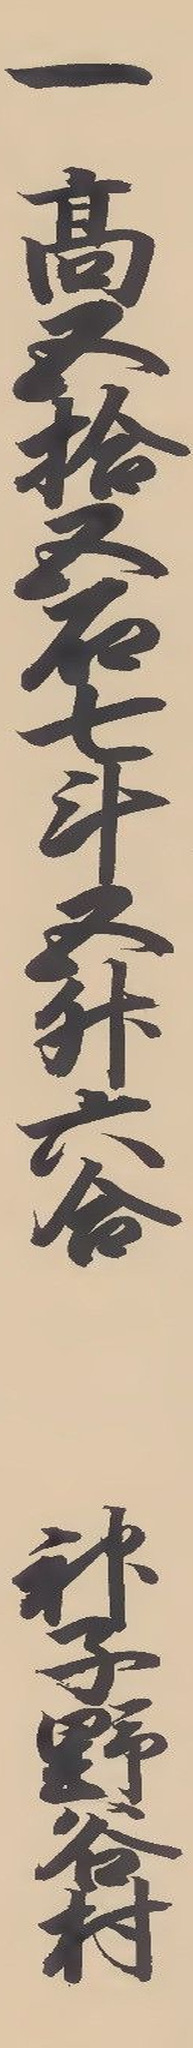一高五拾五石七斗五升六合神子野谷村
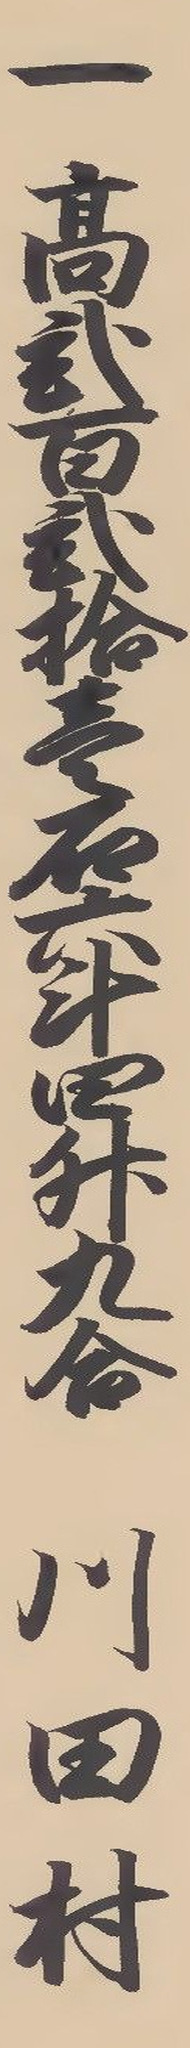一高弐百弐拾壱石六斗四升九合川田村
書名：信濃国郷帳
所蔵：国立公文書館 National Archives of Japan
